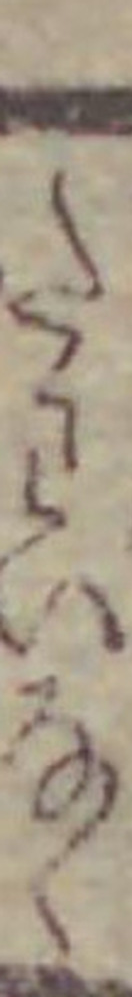たわいなく
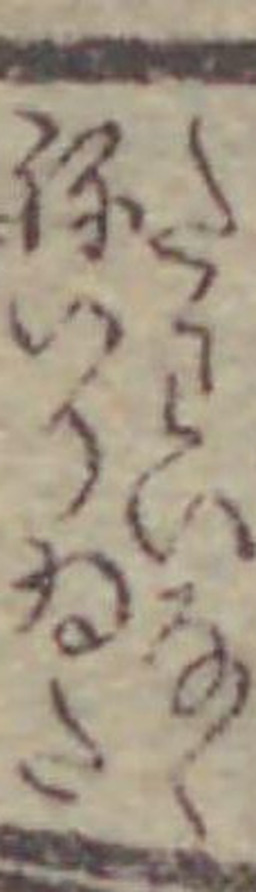ねいりゐた
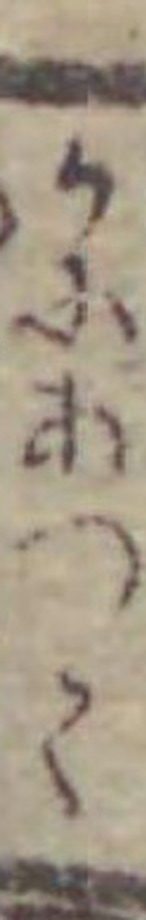かにあつて
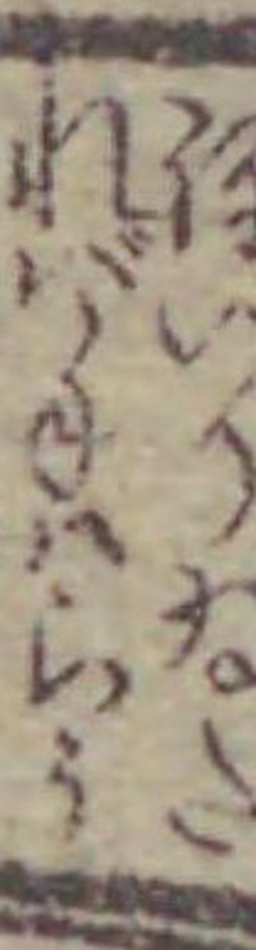れば手はらう
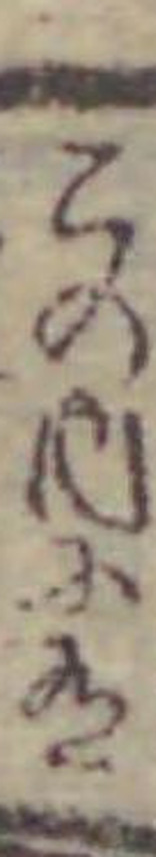この内に有
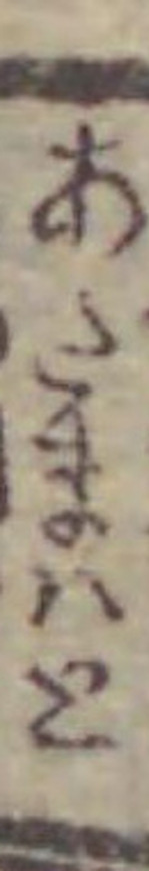あたまはと
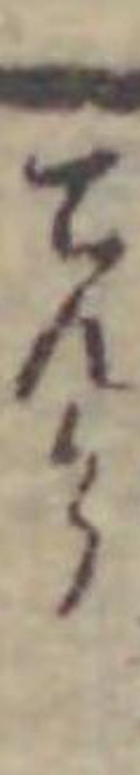てんから
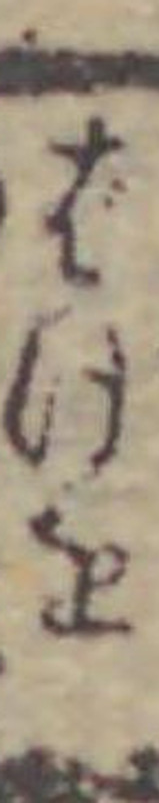ばけを
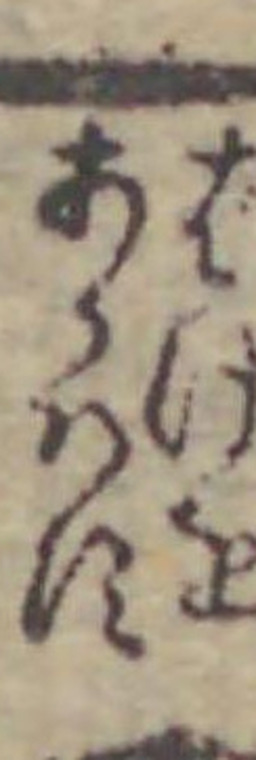あらはす
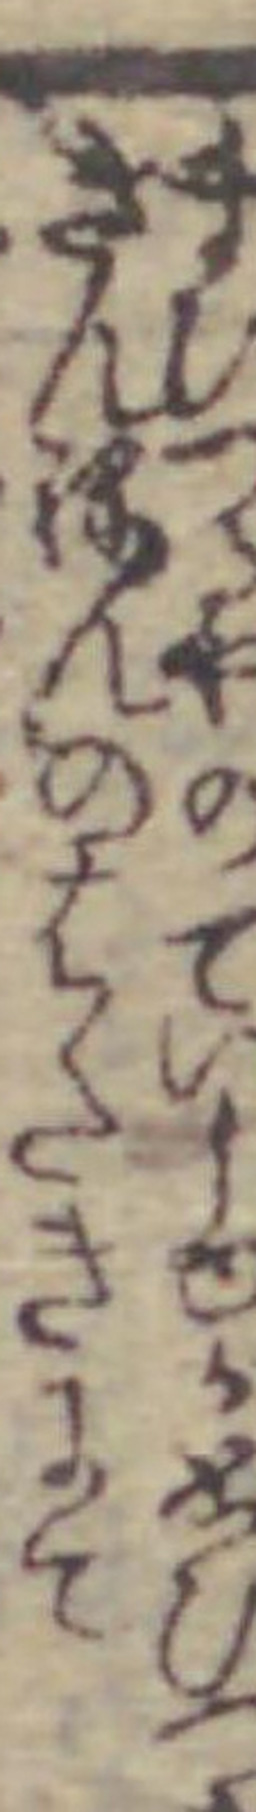きんねんのはたきにて
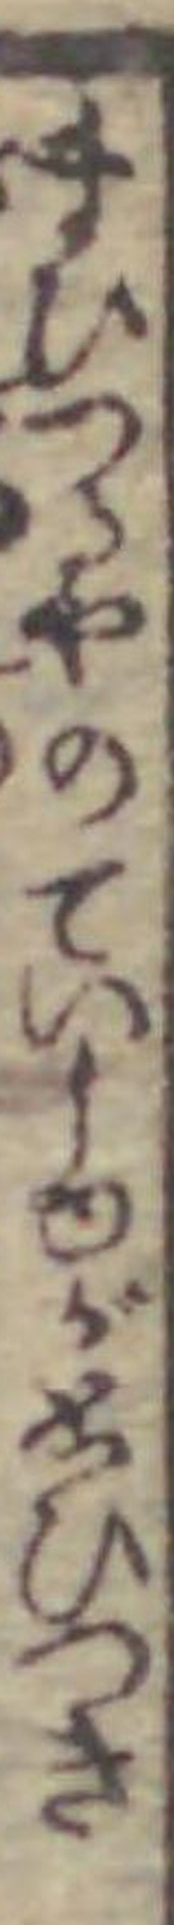まひつるやのていしゆが思ひつき
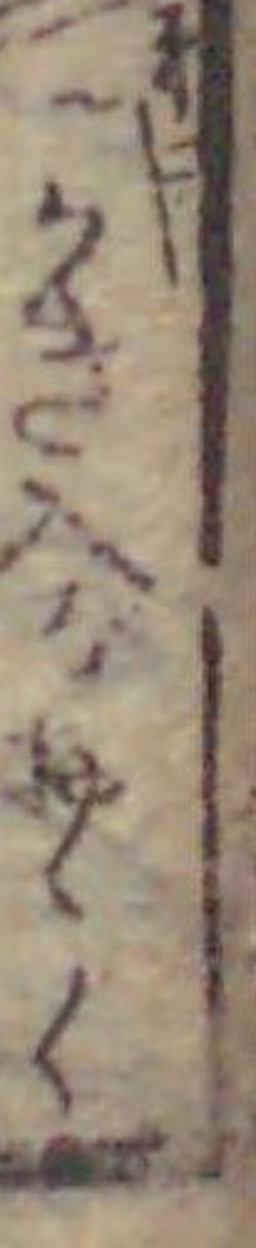〽かき入がおゝく
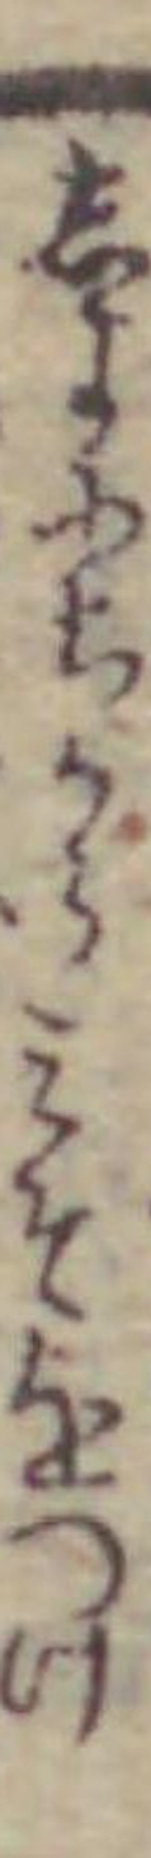しよにちからみそをつけ
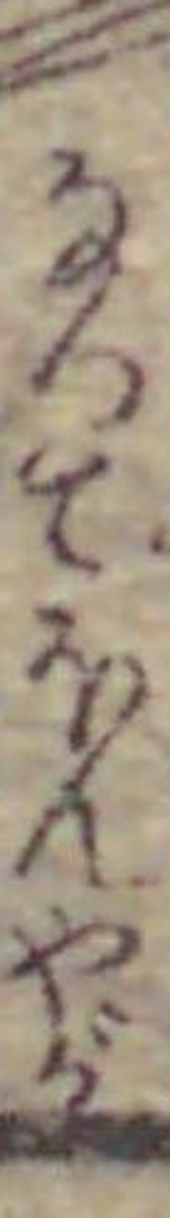なつてほんやが
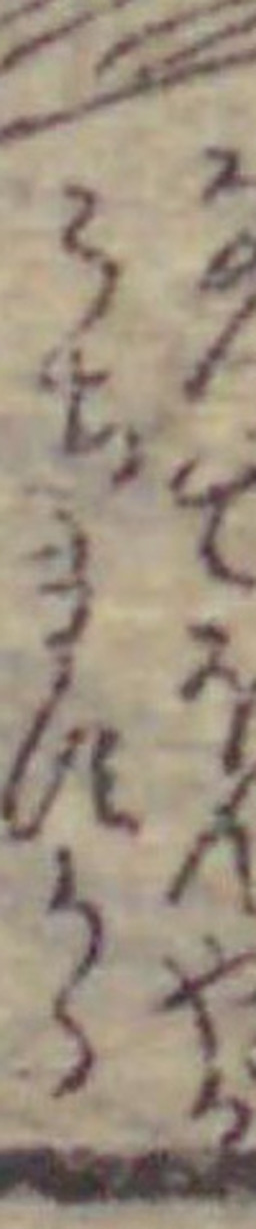うちますから
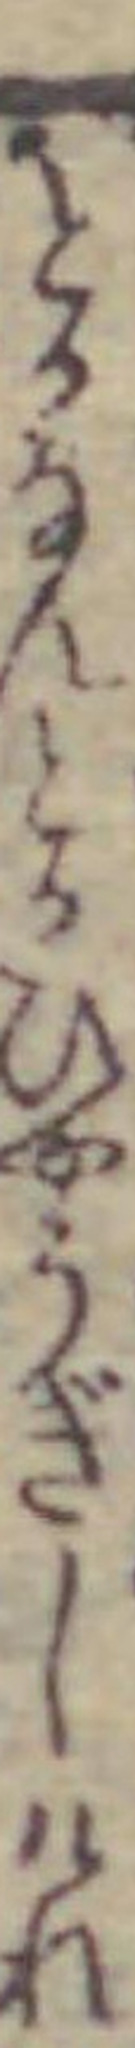とかなんとかひやうぎしけれは
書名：箱入娘面屋人魚 3巻
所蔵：国立国会図書館 National Diet Library, JAPAN
